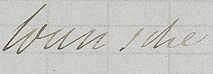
bei der
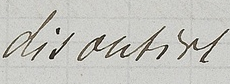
discutirt wer-
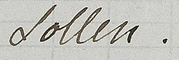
sollen.
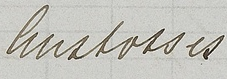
Anstosses
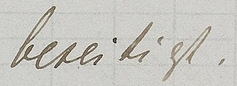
beseitigt.
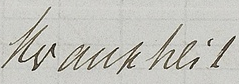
Krankheit des
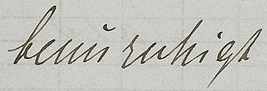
beunruhigt
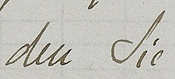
den Sie
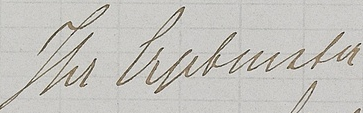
Ihr Ergebenster
